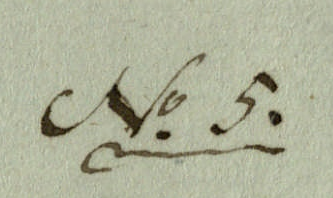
Nº 5.
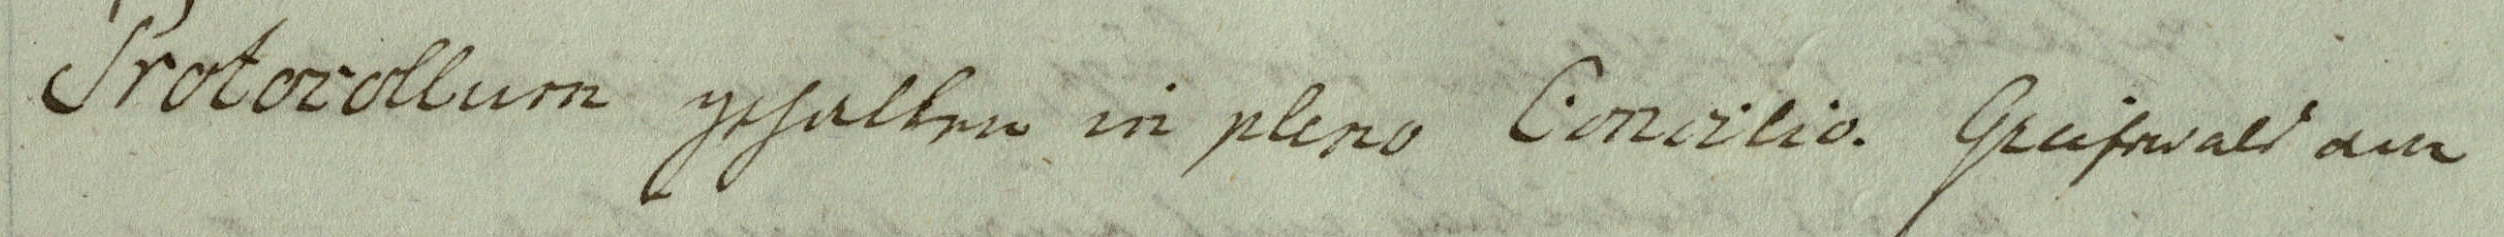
Protocollum gehalten in pleno Concilio. Greifswald am
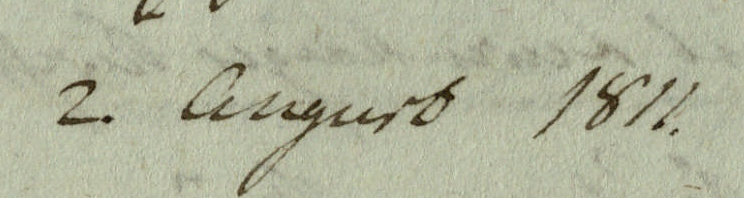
2. August 1811.
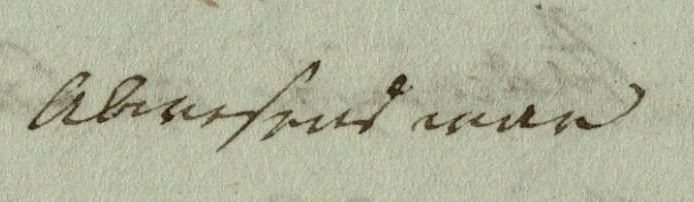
Abwesend war
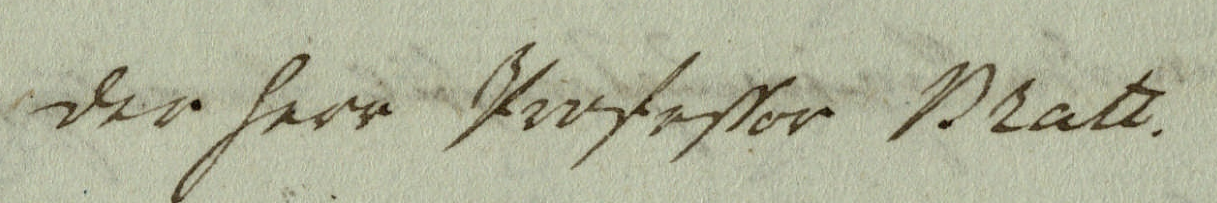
der herr Professor Bratt.
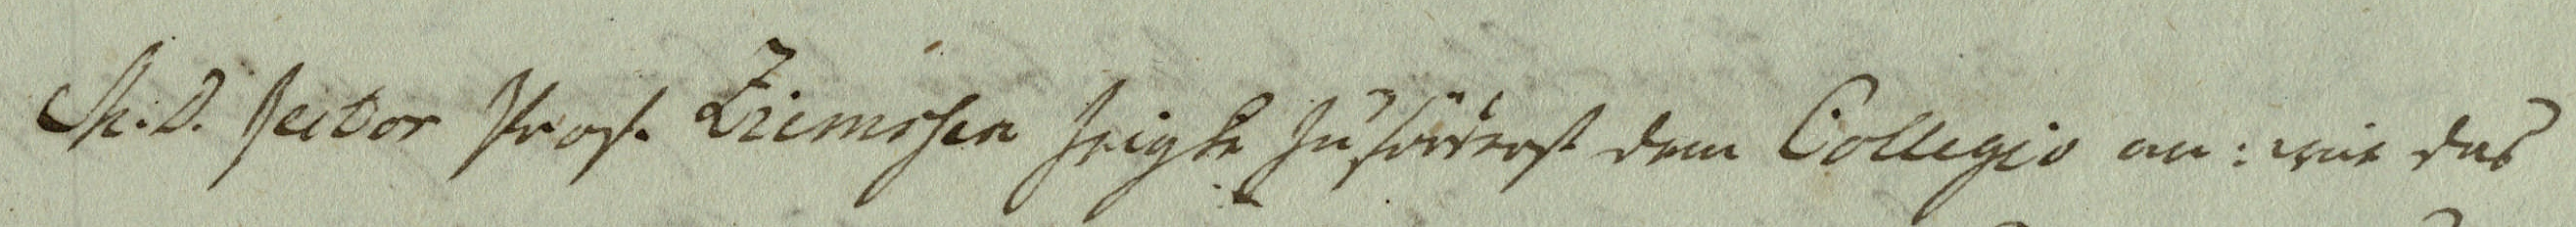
M. D. Rector Prof. Ziemssen zeigte zuförderst dem Collegio an: wie das
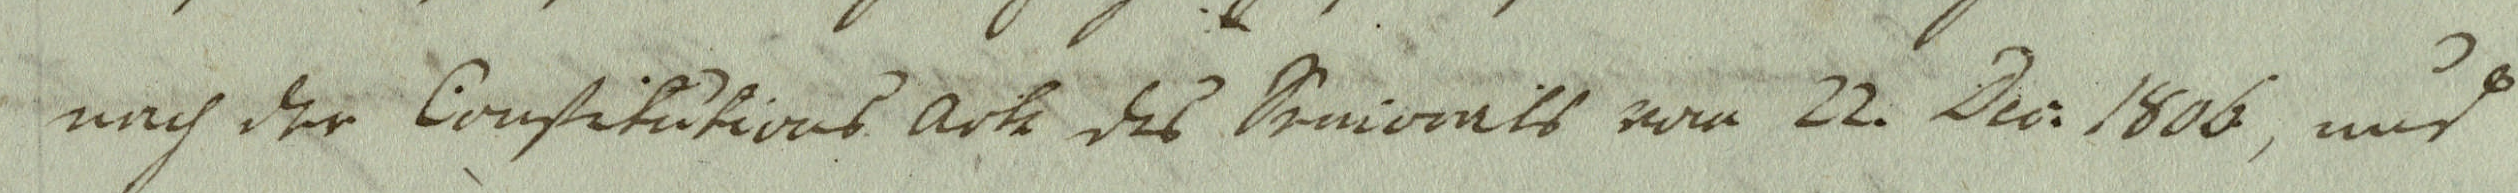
nach der Constitutions Acte des Seniorats vom 22. Dec. 1806, und
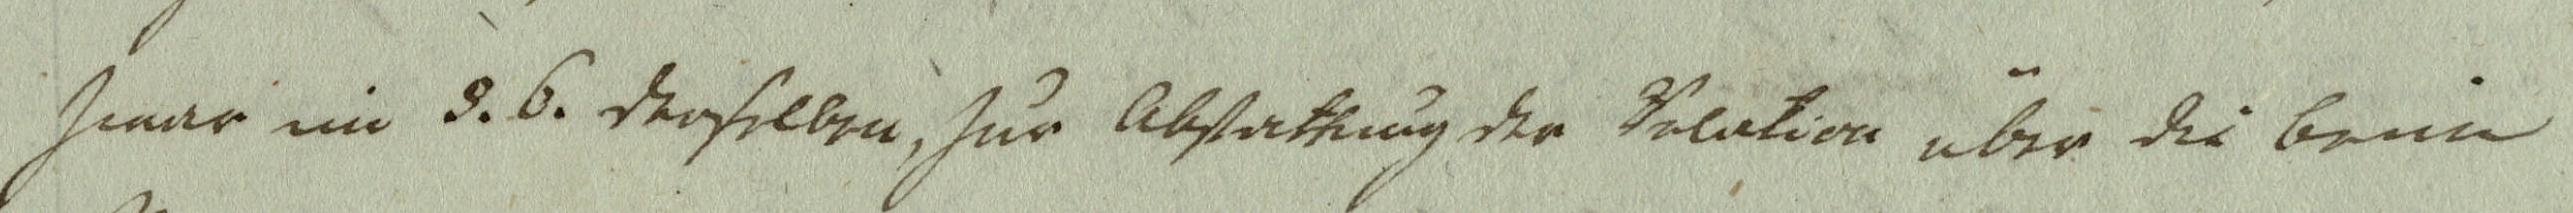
zwar im §. 6. derselben, zur Abstattung der Relation über die beim
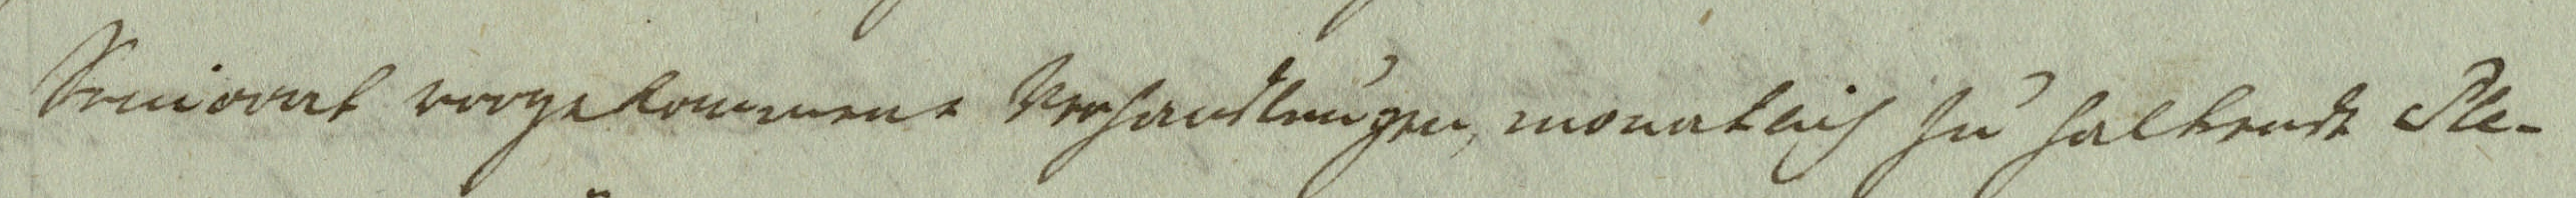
Seniorat vorgekommene Verhandlungen, monatlich zu haltende Ple¬
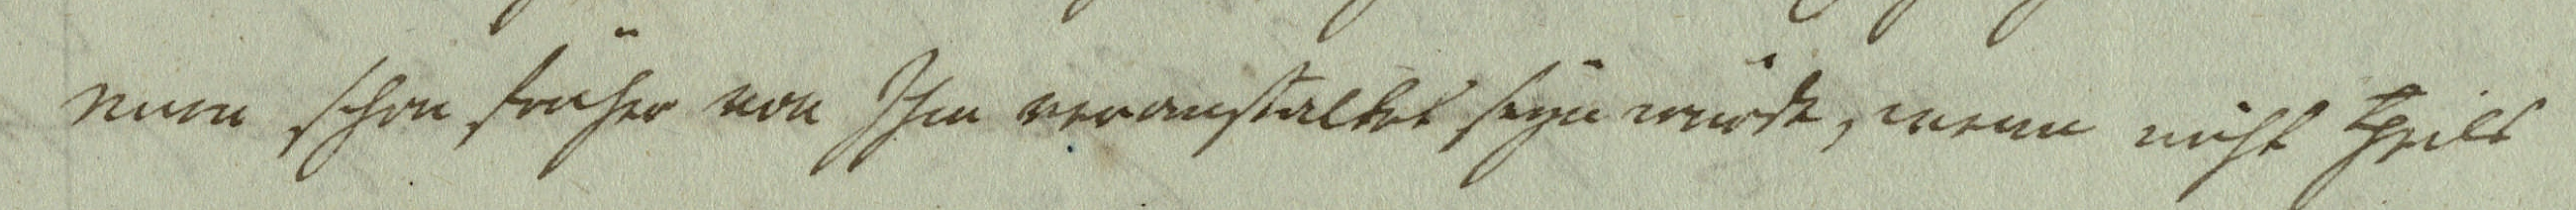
num schon früher von Ihm veranstaltet seÿn würde, wenn nicht theils
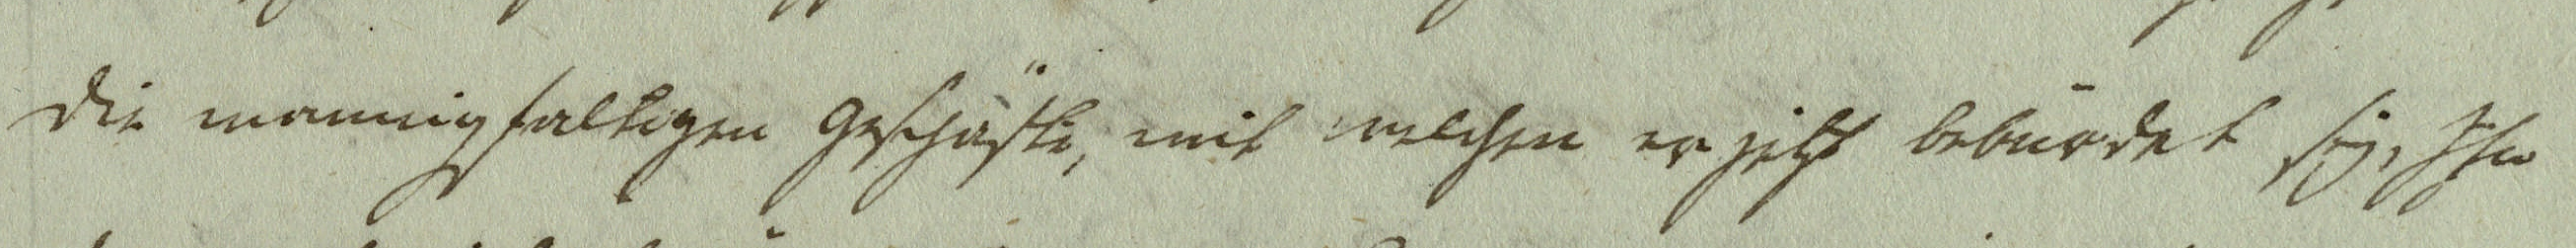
die mannigfaltigen Geschäfte, mit welchen er jetzt bebürdet seÿ, Ihn
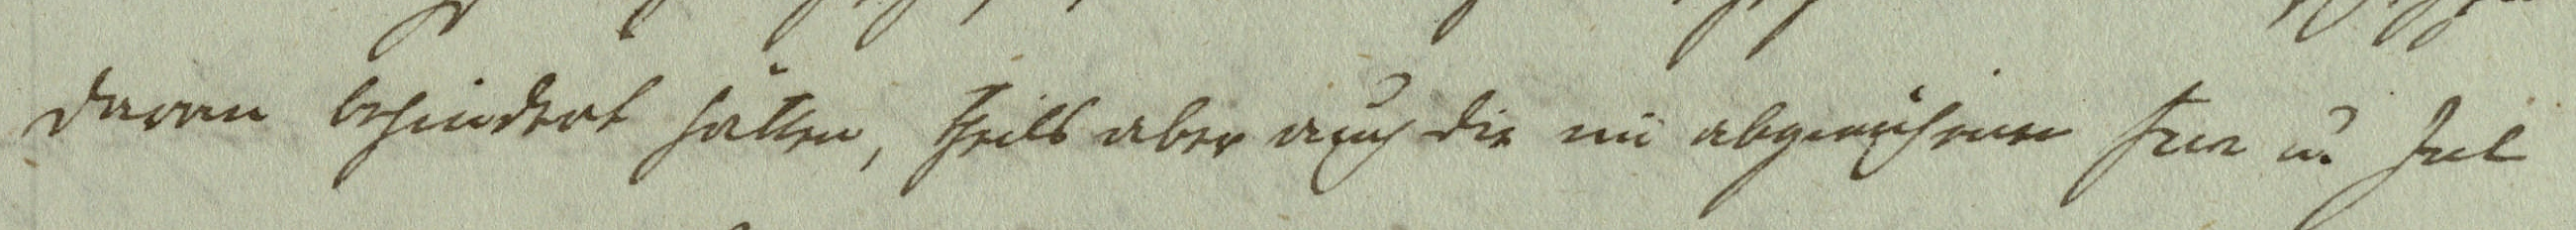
daran gehindert hätten, theils aber auch die im abgewichenen Jun. u Juli
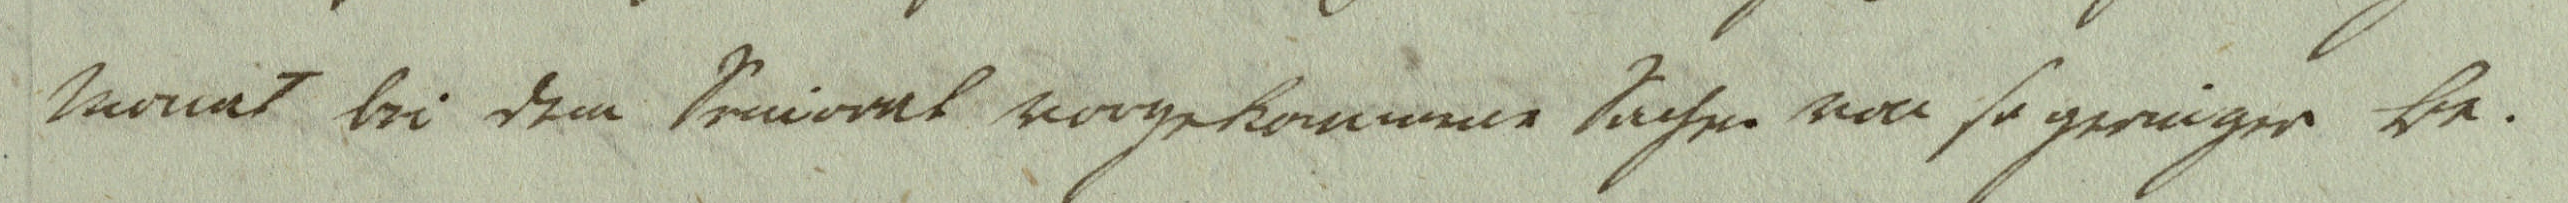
Monat bei dem Seniorat vorgekommene Sachen von so geringer Be¬
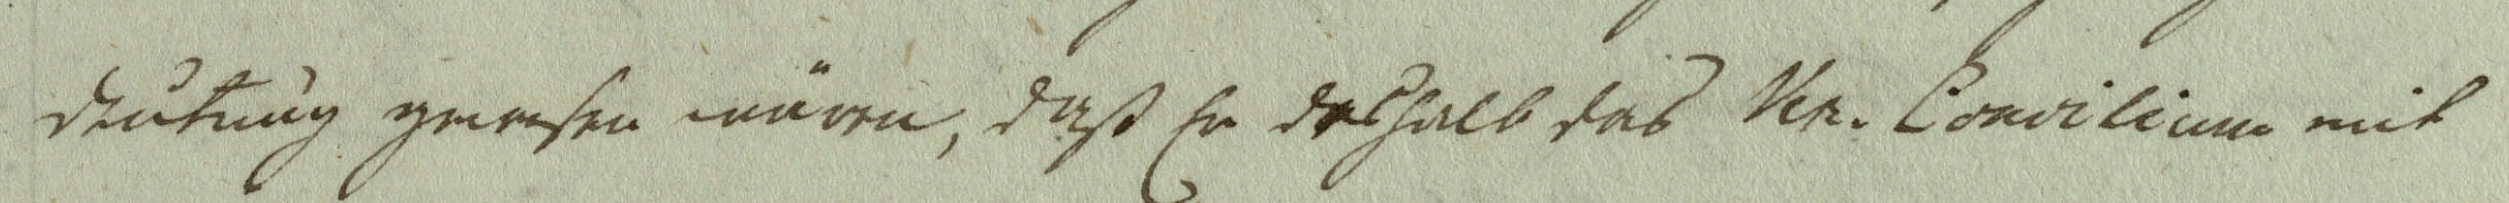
deutung gewesen wären, daß Er deshalb das Ven. Concilium mit
